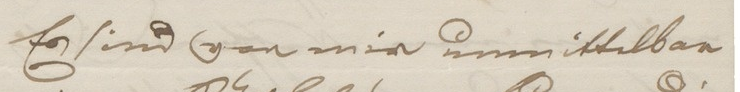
Es sind von mir unmittelbar
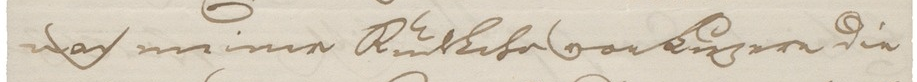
nach meiner Rückkehr von Luzern die
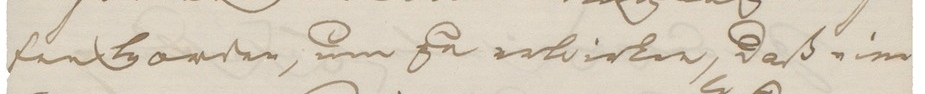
fen worden, um zu erwirken, daß eine
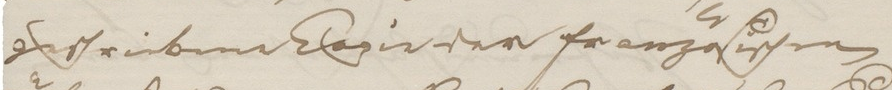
geschriebenen Copie der französischen
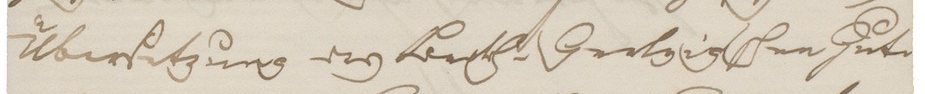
Übersetzung des Beckh-Gerwig'schen Gut-
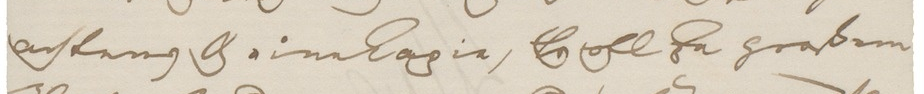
achtens & eine Copie, wohl zu großem
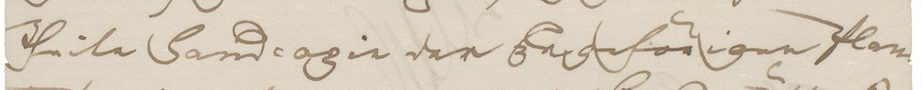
Theile Handcopie der zugehörigen Plane
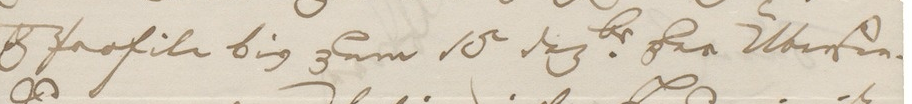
& Profile bis zum 15 Dezbr zur Übersen-
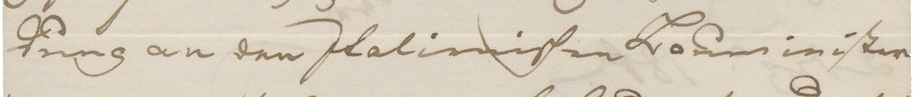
dung an den Italienischen Bauminister
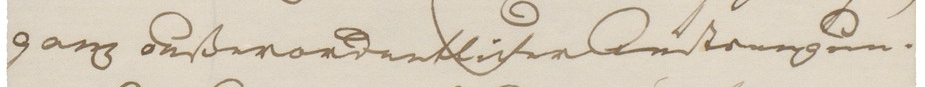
ganz außerordentlicher Antstrengun-
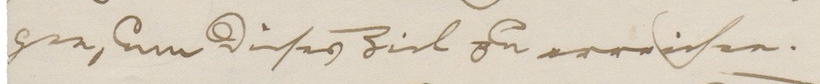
gen, um dieses Ziel zu erreichen.
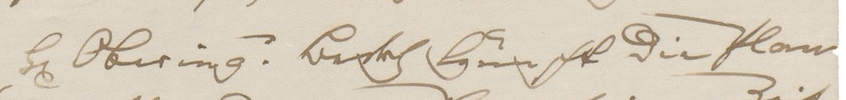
Hr OberingrBeckh wünscht die Plane
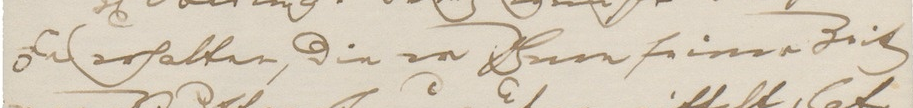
zu erhalten, die er Ihnen seiner Zeit
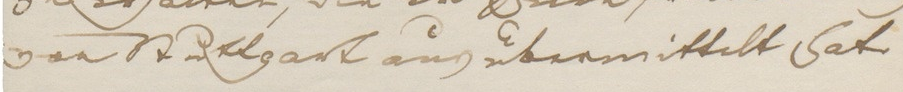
von Stuttgart aus übermittelt hat.
